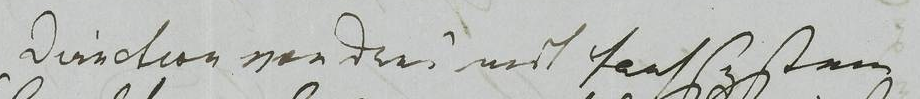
Direction von drei mit Fachsystem
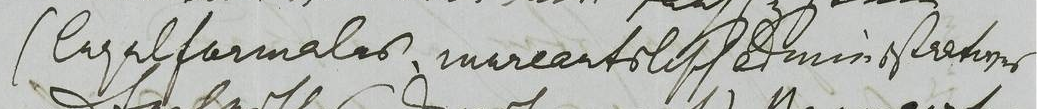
(legalformales, mercantilisch administratives
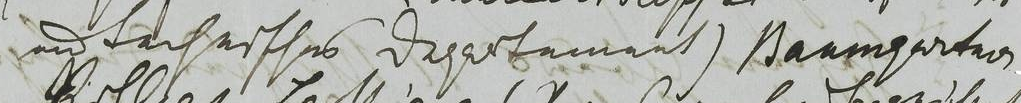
und technisches Departement) Baumgartner,
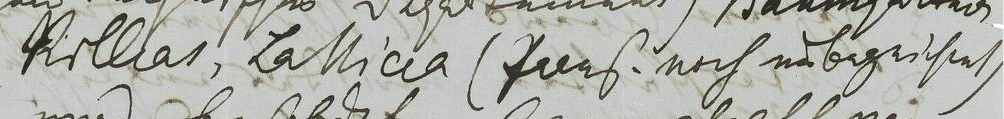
Killias, La Nicca (Praes. noch unbezeichnet)
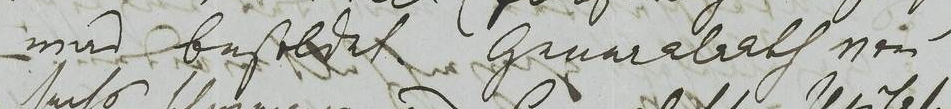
wird besoldet. Generalrath von
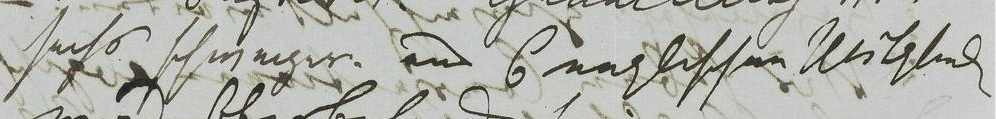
sechs schweizer. und 6 englischen Mitgliedern
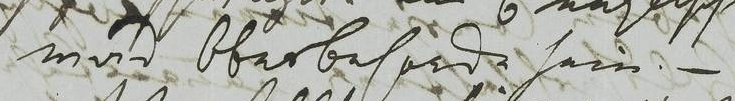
wird Oberbehörde sein. –
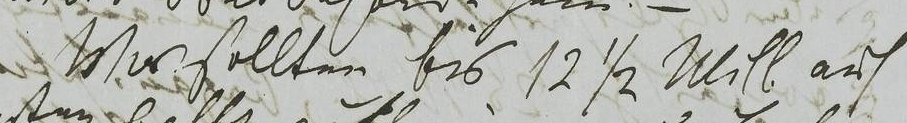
Wir sollten bis 12½ Mill. auf
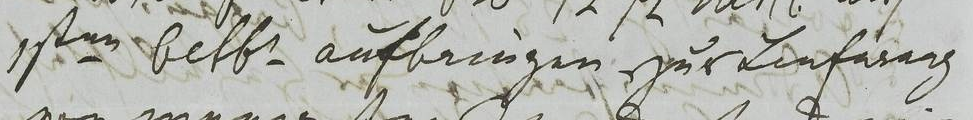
1sten Octbr aufbringen zur Lieferung
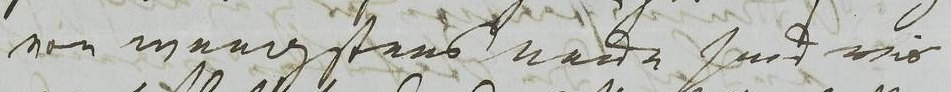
von wenigstens neun sind wir
